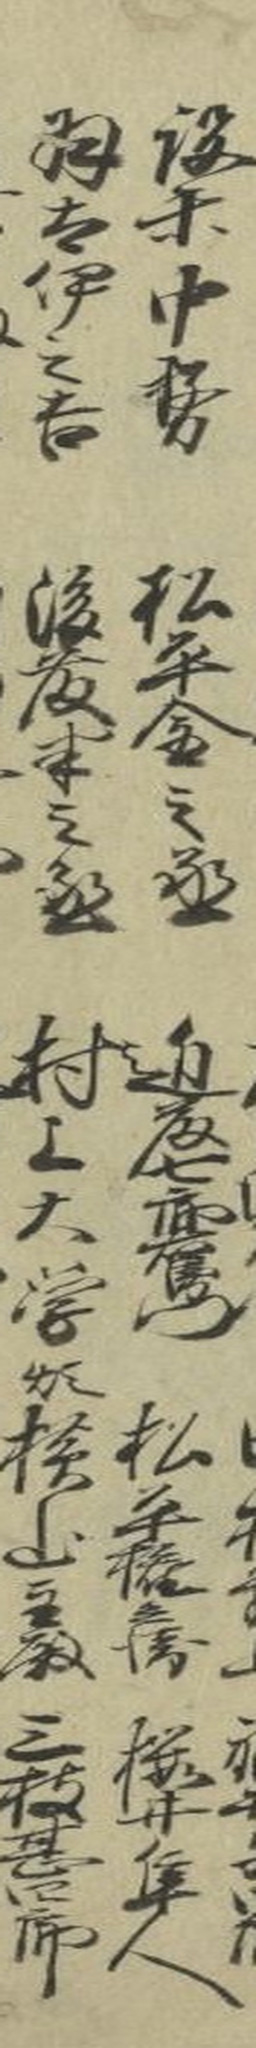羽太伊之吉後藤半之丞村上大学煩桧山主殿三枝甚四郎
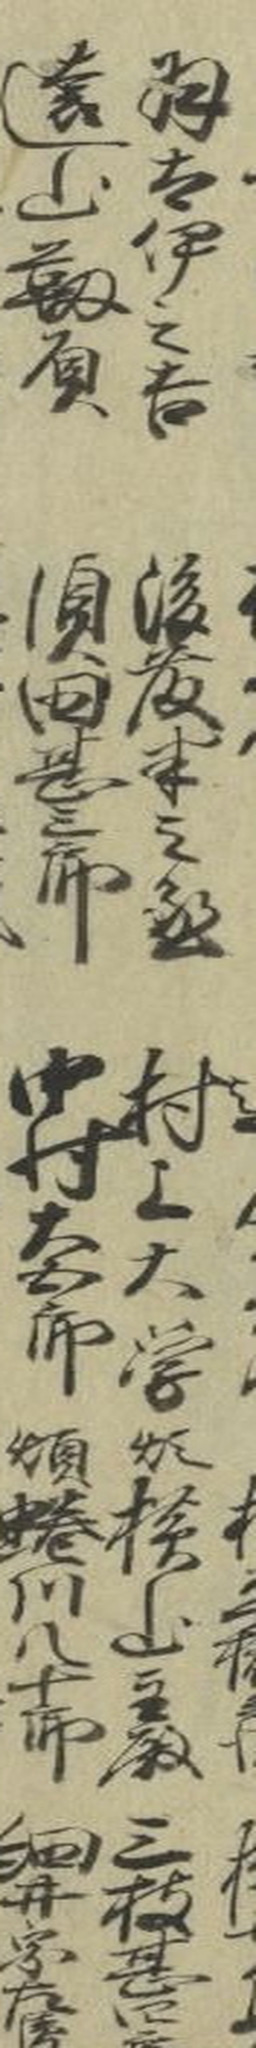遠山靱負須田甚三郎中村大五郎煩蜷川八十郎細井宗左衛門

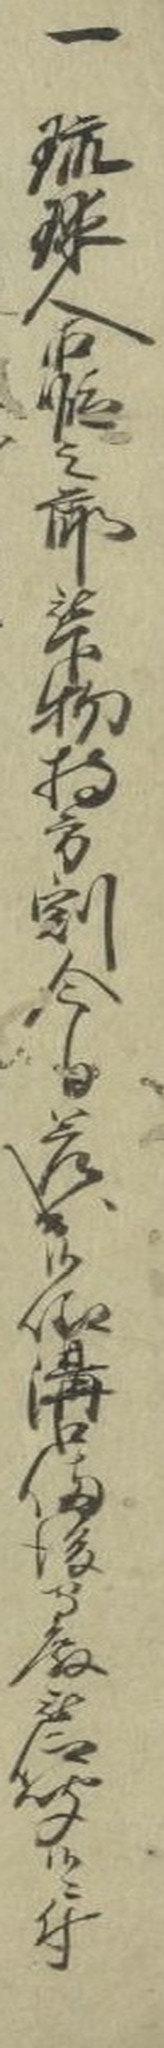一琉球人御暇之節被下物持方割今日差出候様溝口備後守殿被仰聞候に付
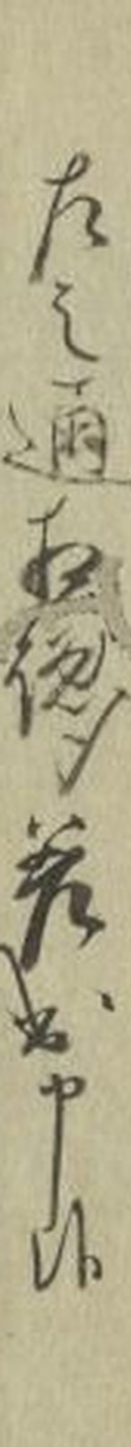左之通相認め差出申候
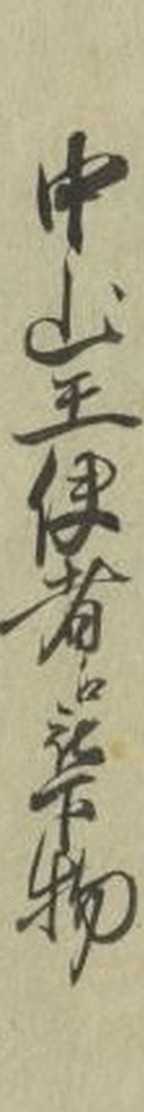中山王使者え被下物
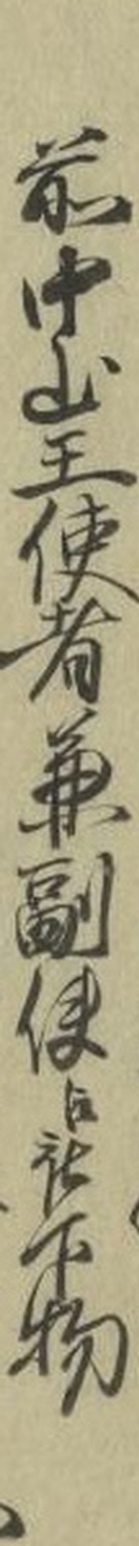前中山王使者兼副使え被下物
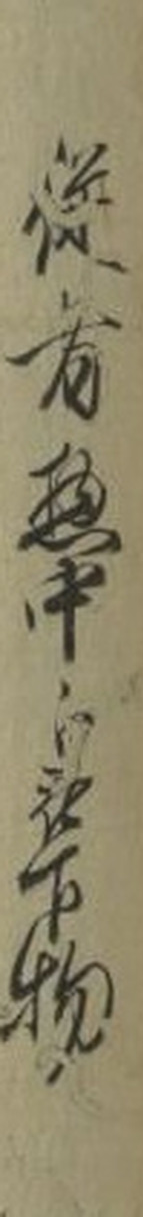従者惣中え被下物
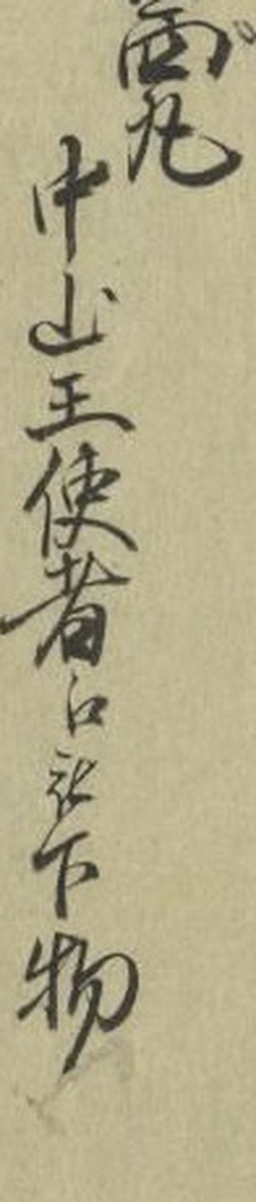中山王使者え被下物

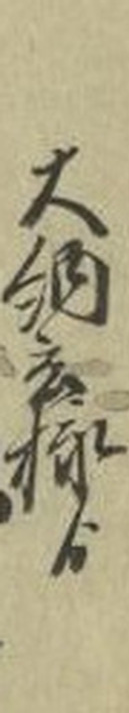大納言様ゟ
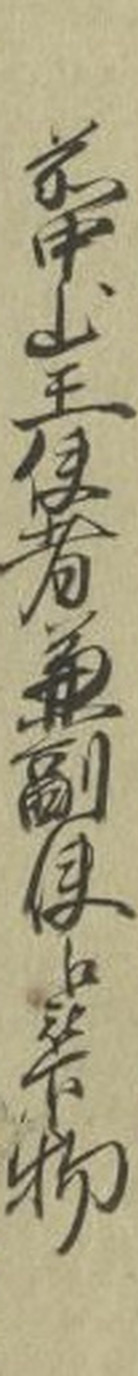前中山王使者兼副使え被下物
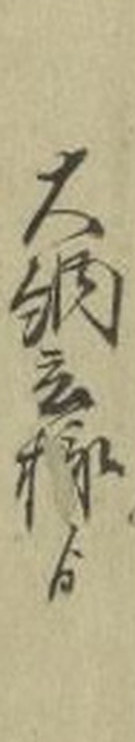大納言様ゟ
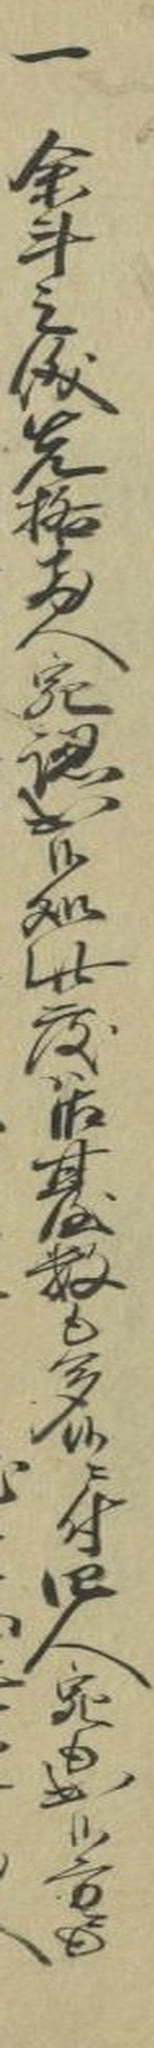一余計之儀先格両人宛認出候処此度は御台数も多候に付四人宛も出候方にも
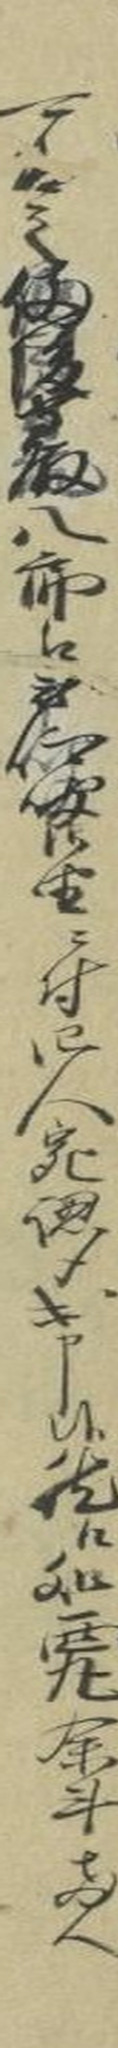可有之備後殿八郎え被仰聞候由に付四人宛認め出申候然る処西丸余計両人
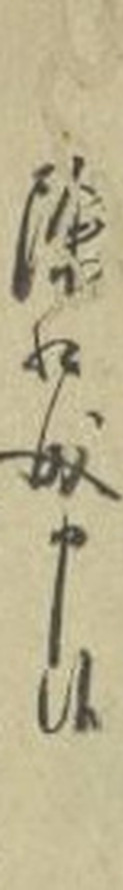除相成申候
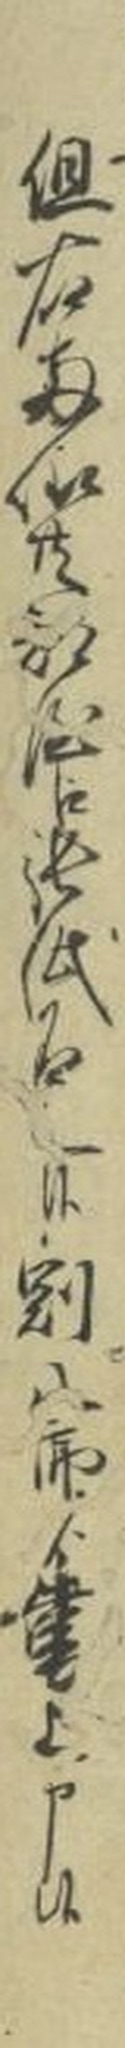但右両様共部屋え張紙有之候割八郎ゟ書上申候
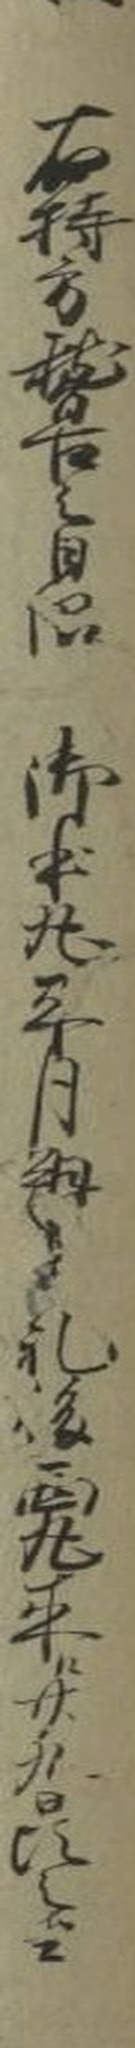一右持方稽古之日限御本丸来月朔日御礼後西丸来る廿九日頃之由
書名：天保三壬辰年琉球人参府之節勤方書留
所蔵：University of the Ryukyus Library
